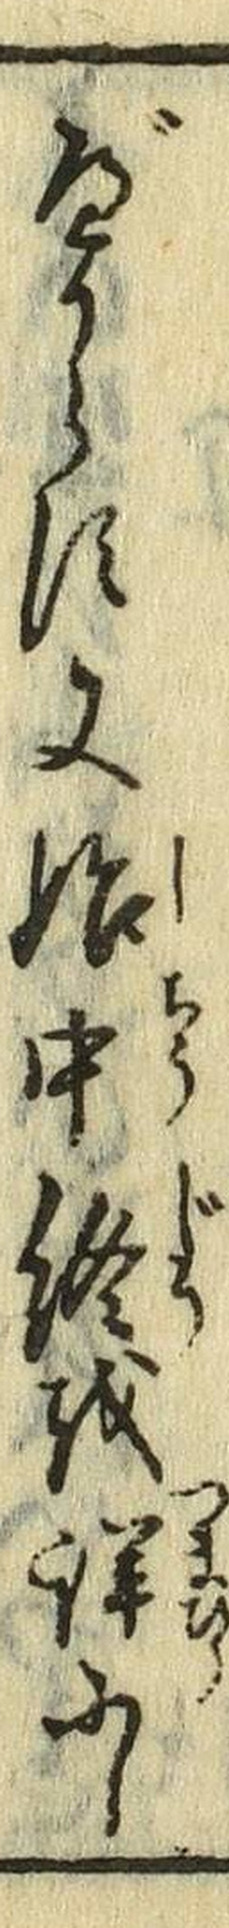べからす又始中終を詳にし
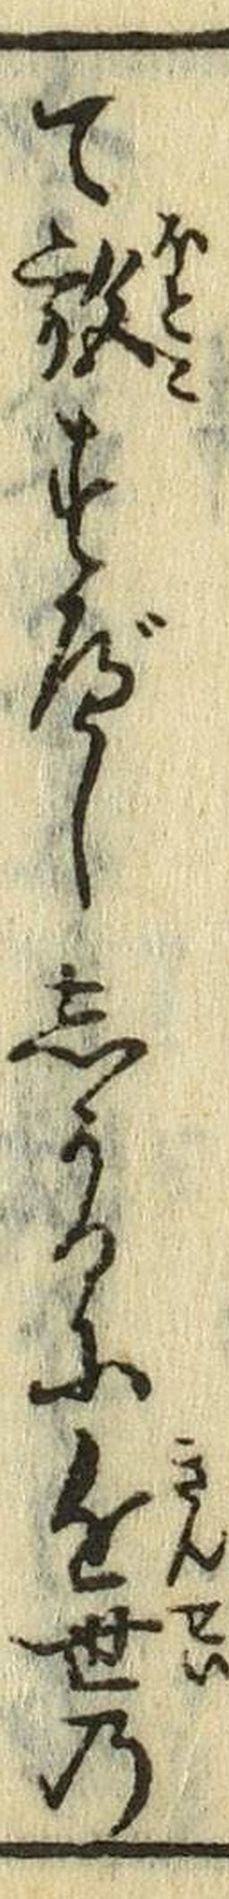て施すべししかるに近世の
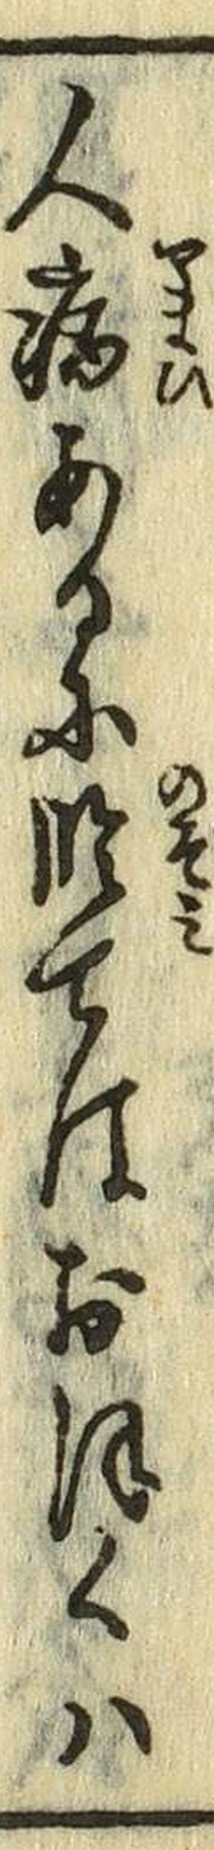人病あるに臨てはおほくは
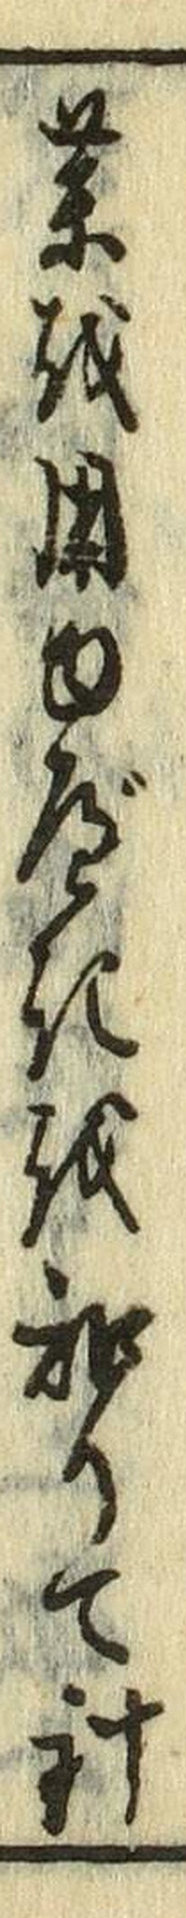薬を用ゆべきを知りて針
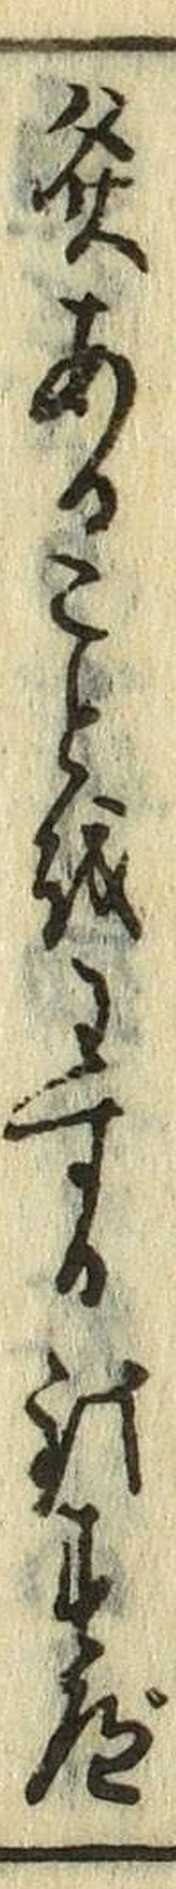灸あることをわする針すべ
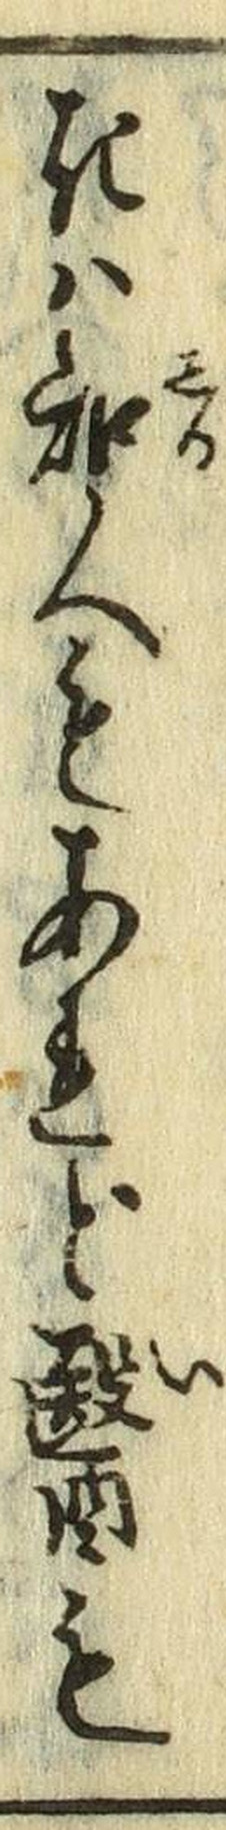きは知人もあれど医も
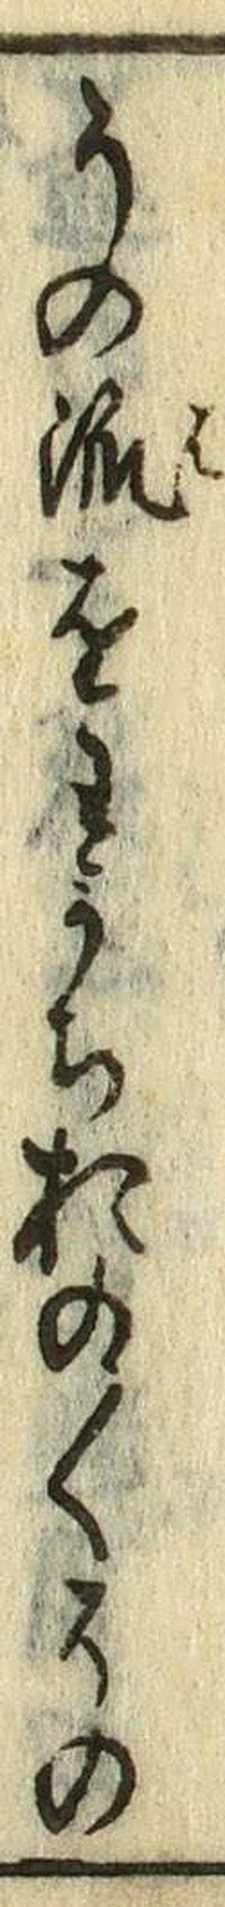その派をわかちおの〳〵その
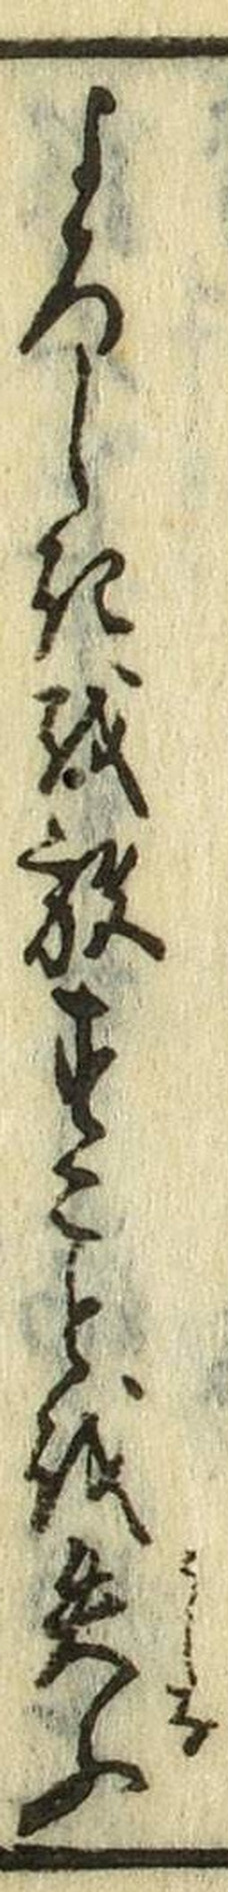よろしきを施すことを失ふ
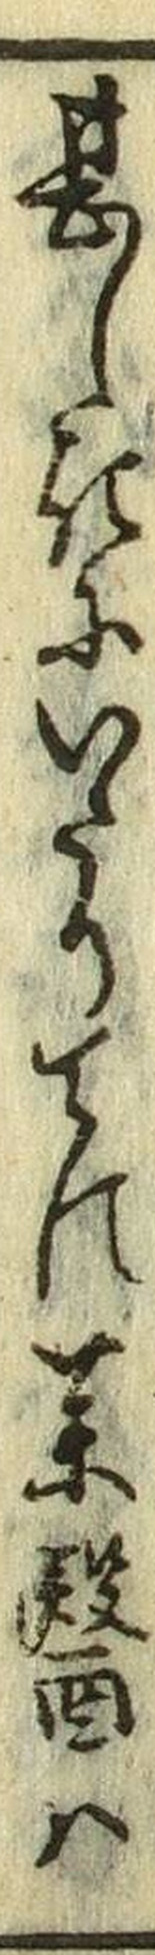甚しきにいたりては薬医は
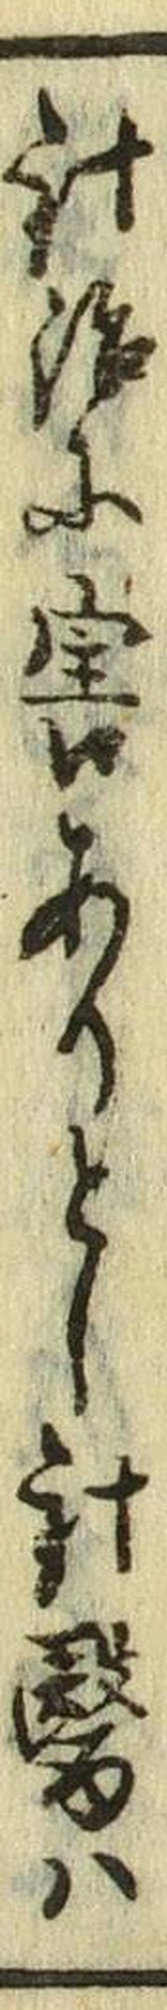針治に害ありとし針医は

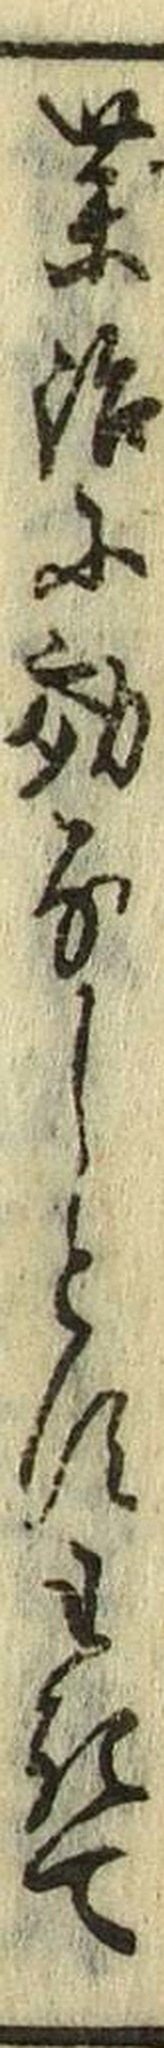薬治に効なしとすわきて
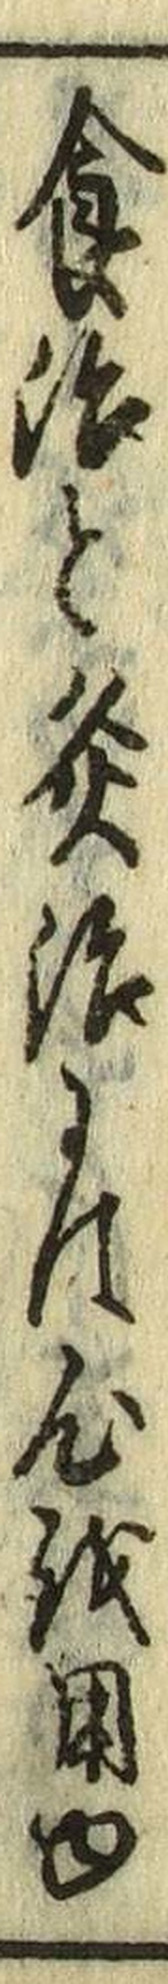食治と灸治には心を用ゆ
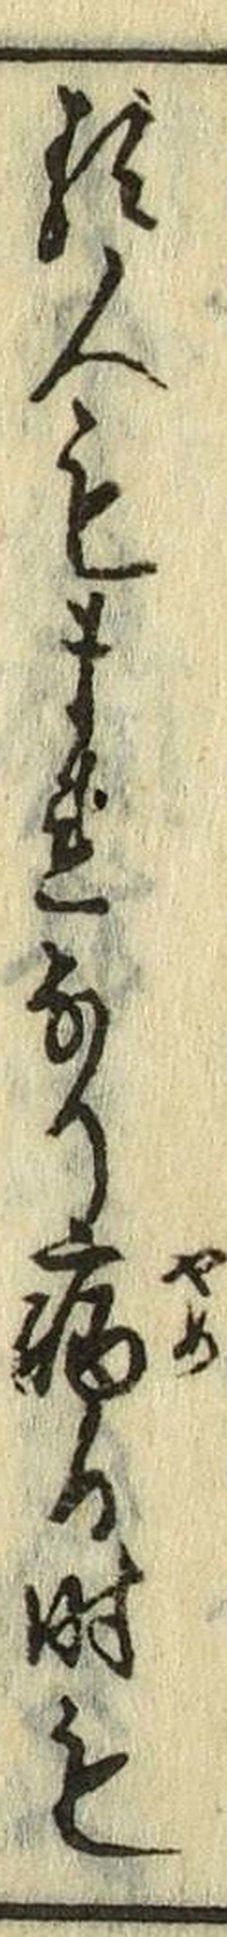る人もまれなり病る時も
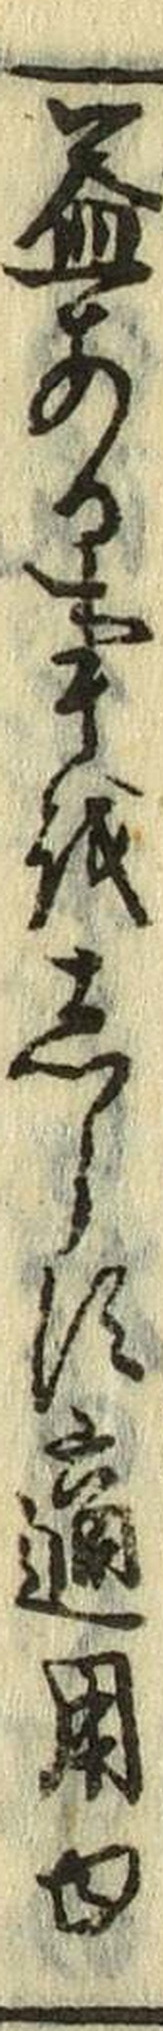益ある事をしらす適用ゆ
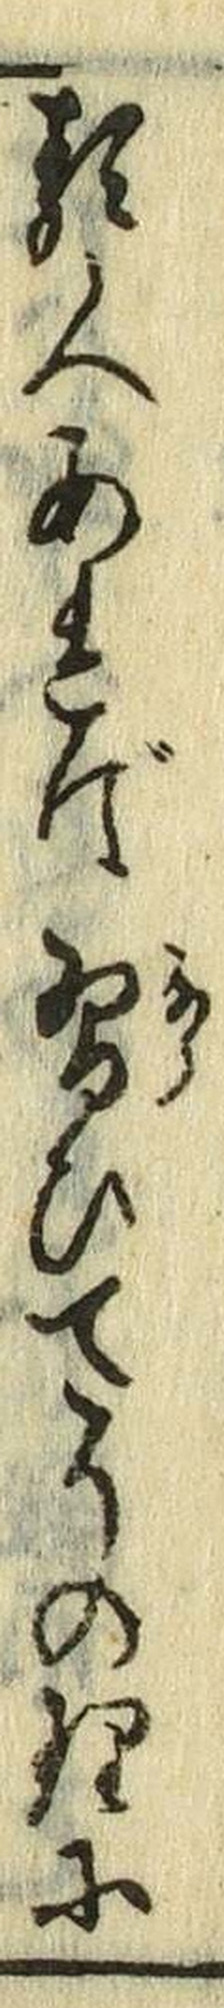る人あれば習ひてその理に
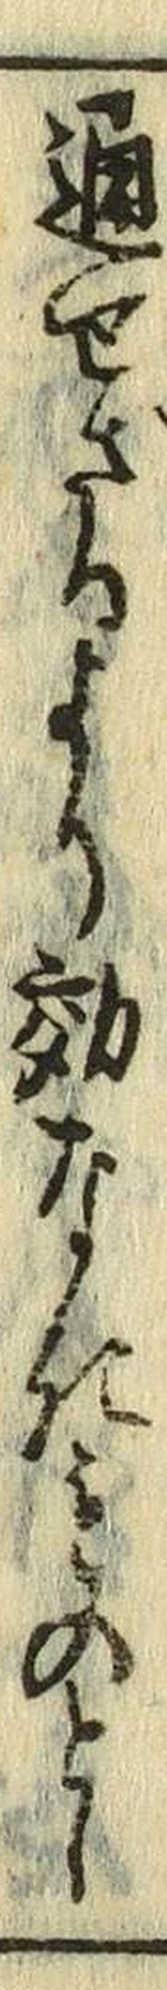通ぜざるより効なきものとし
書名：居家養生記
